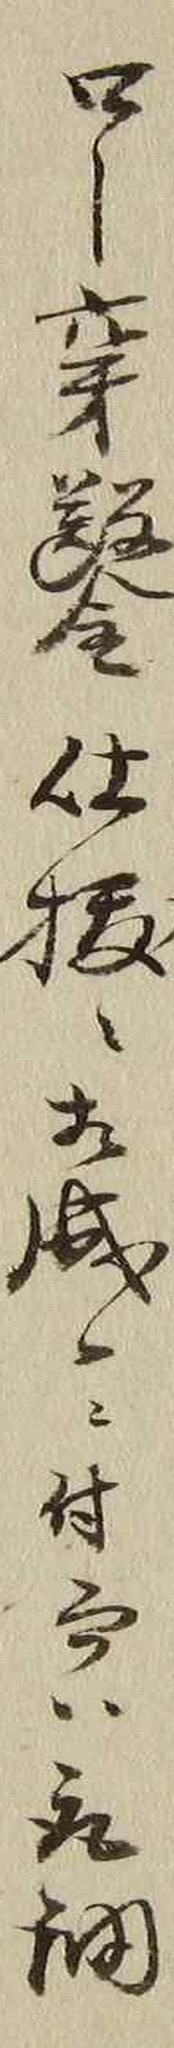口之穿鑿仕抜ニ相成候ニ付而ハ取調
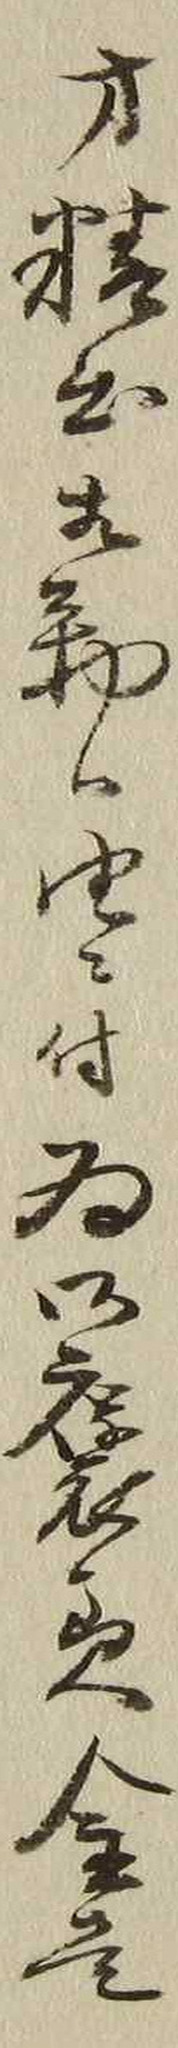方精出相勤候由ニ付為御褒美金壱
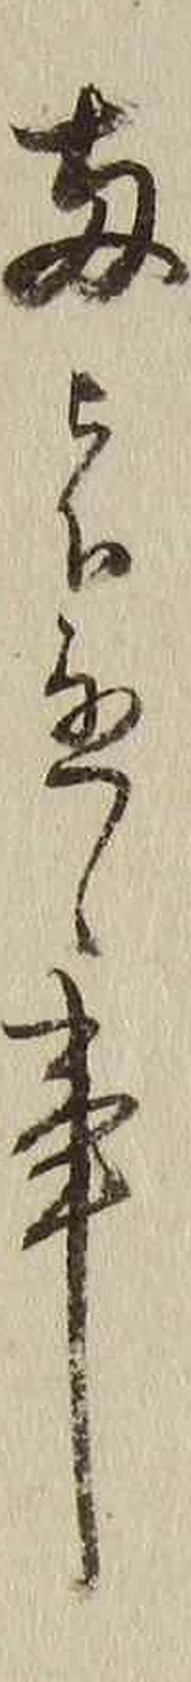両被下置候事
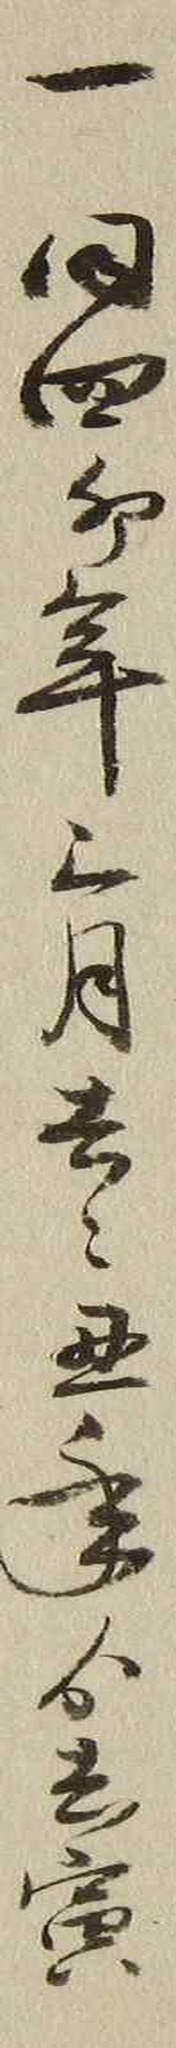一同四卯年三月去々丑年ゟ去寅
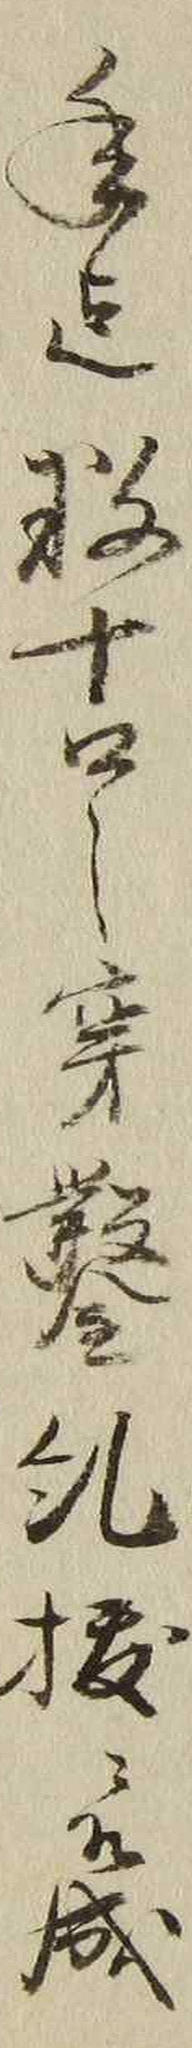年迄数十口之穿鑿糺抜ニ相成
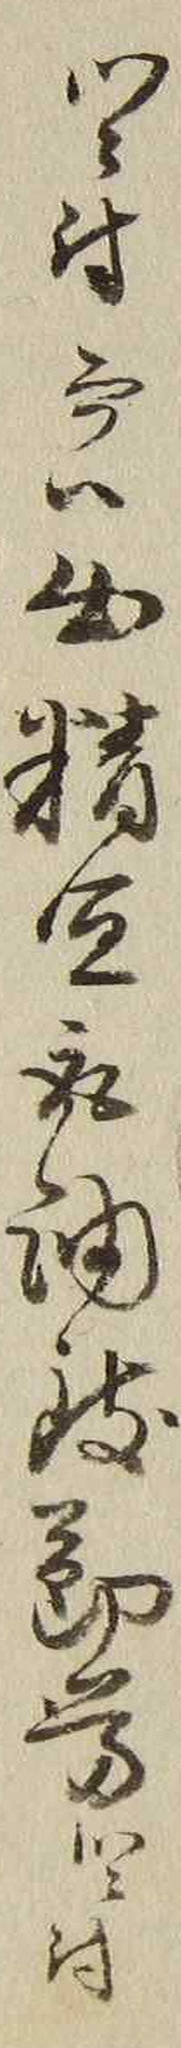候ニ付而ハ出精宜取調致勤労候ニ付
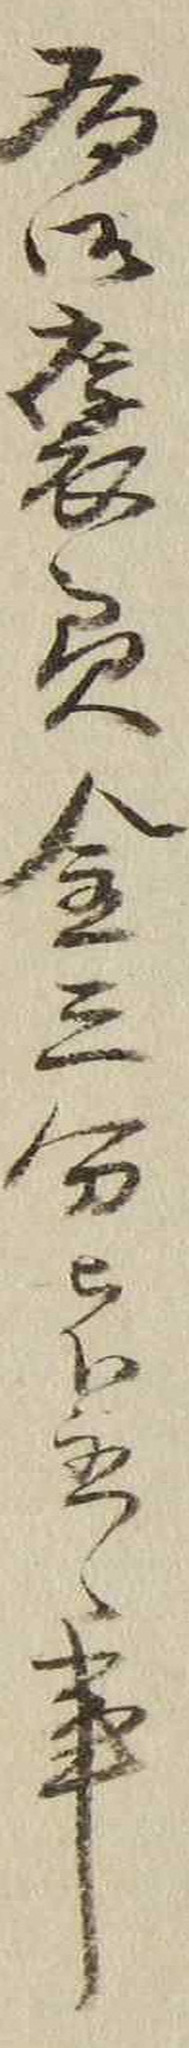為御褒美金三分被下置候事
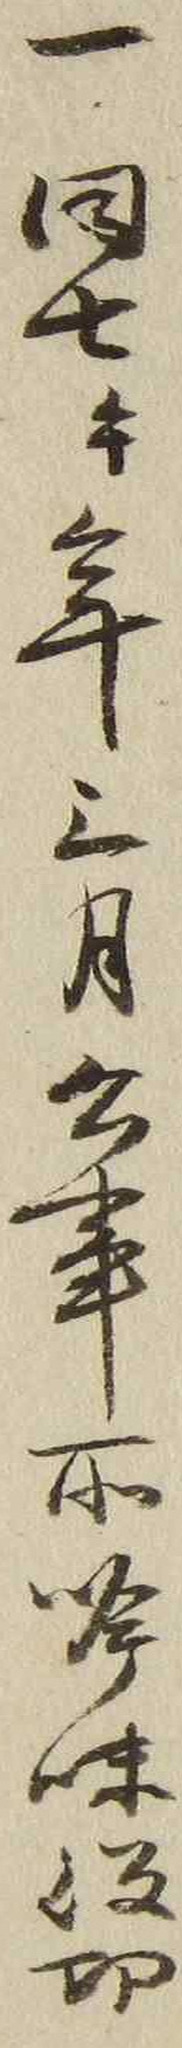一同七午年三月公事所吟味役切

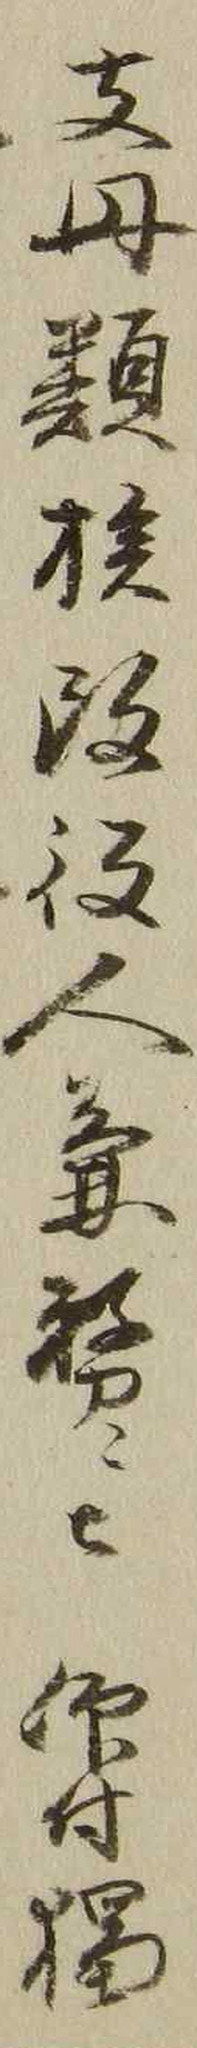支丹類族改役人兼務ニ被仰付独
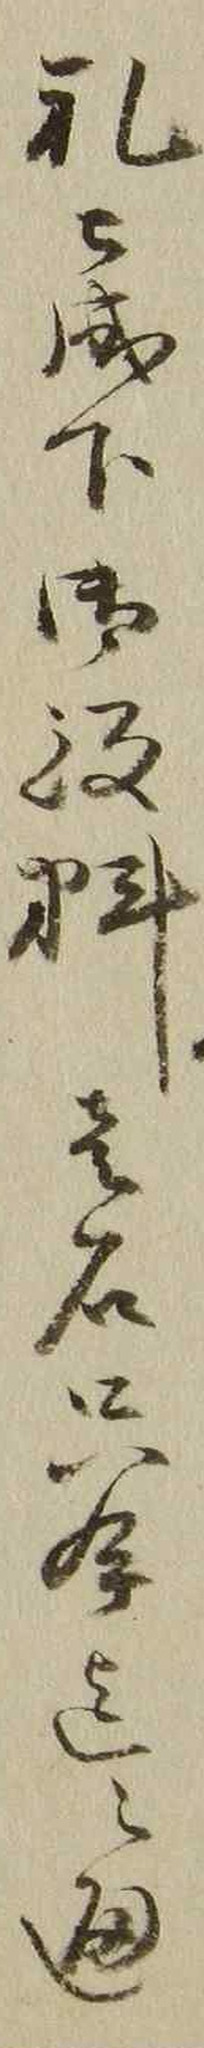礼被成下御役料壱石只今迄之通
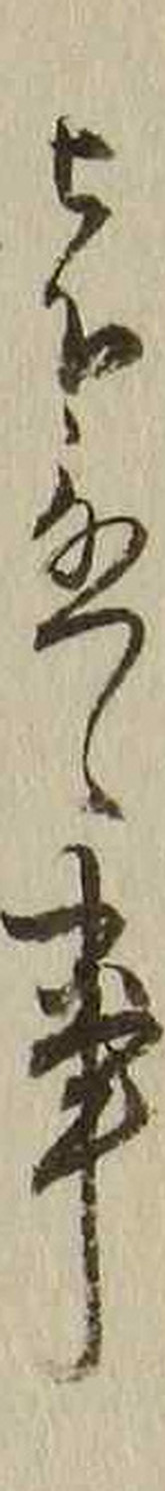被下置候事
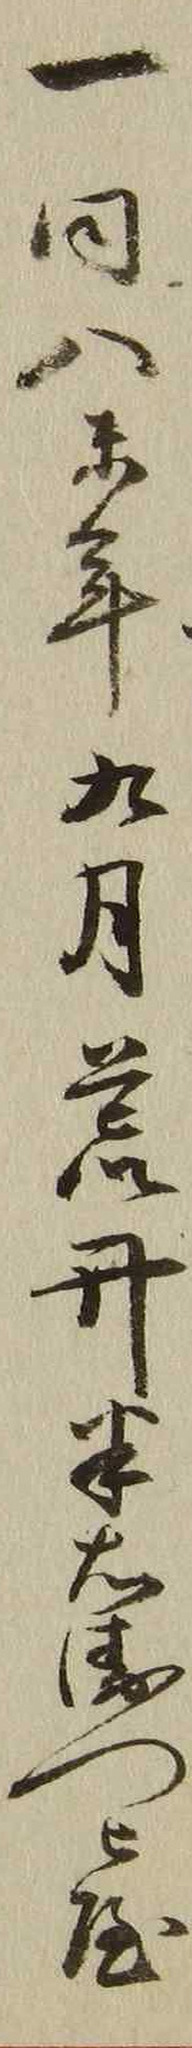一同八未年九月荒井半右衛門被屋
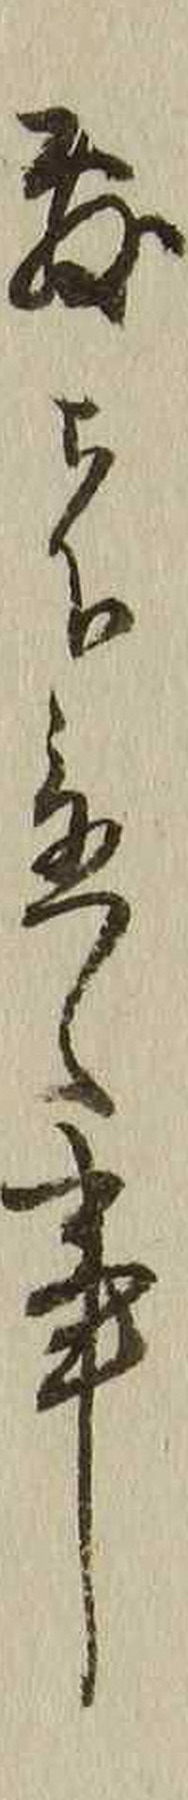敷被下置候事
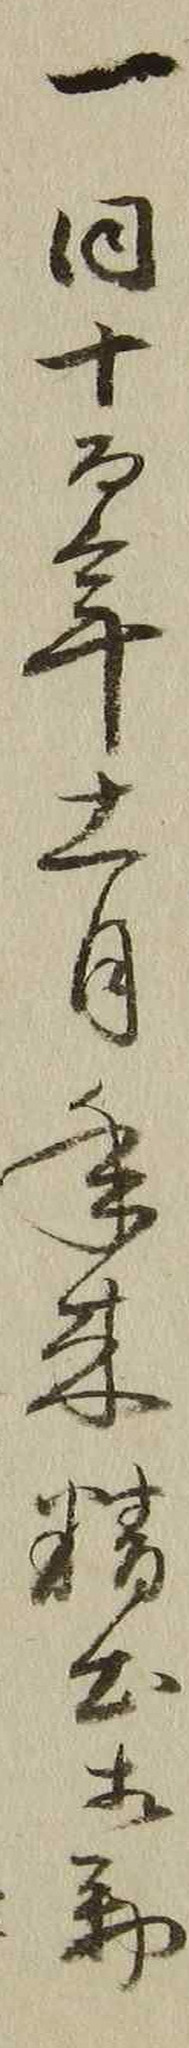一同十酉年十一月年来精出相勤
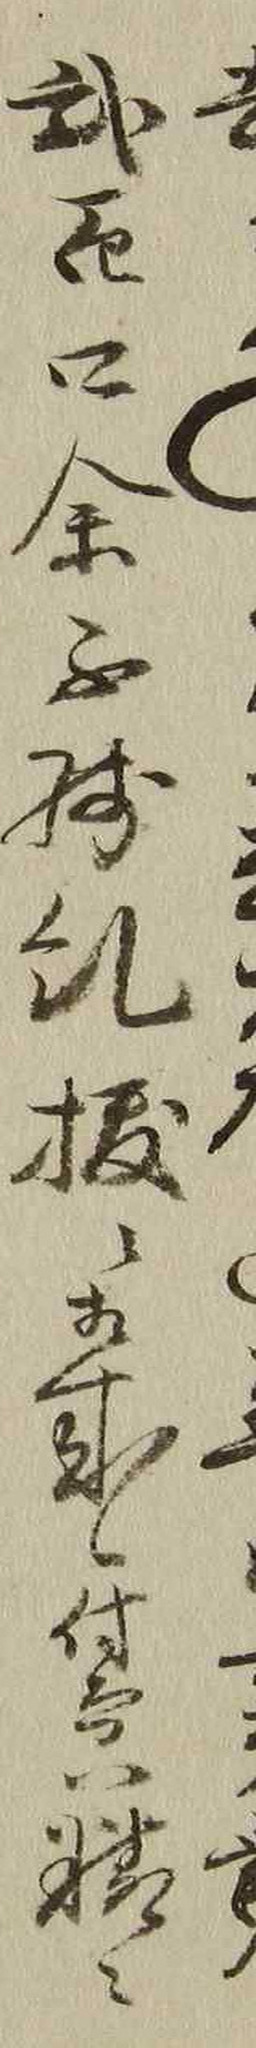弐百口余不残糺抜ニ相成候付而ハ精々
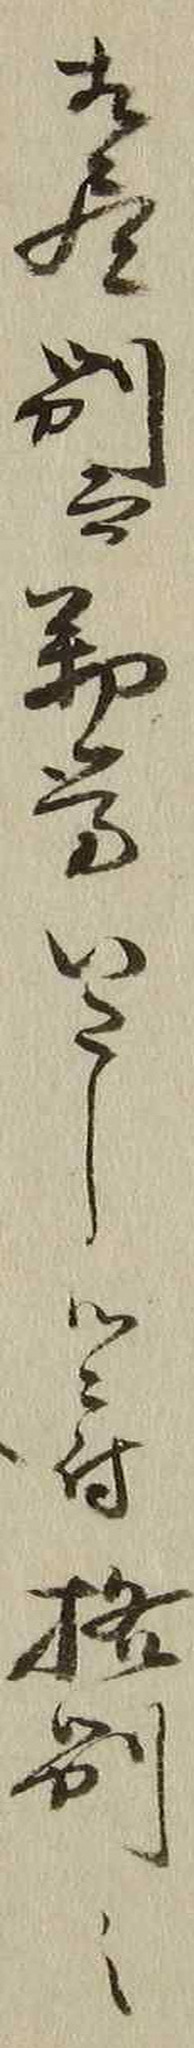相尽別而勤労いたし候ニ付格別之
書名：諸士系譜　巻之236　ふ之部4
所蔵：会津若松市立会津図書館
